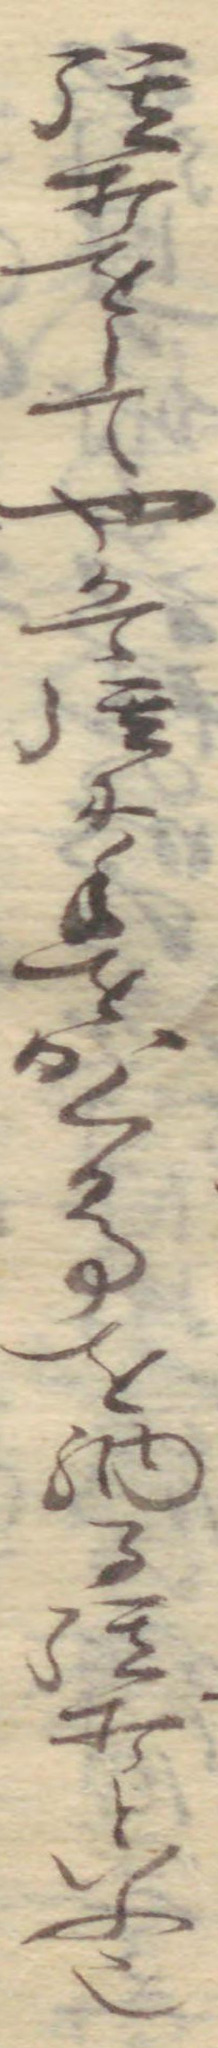弦打をしてやかて弦に手をかくる事を納る弦打といふ也
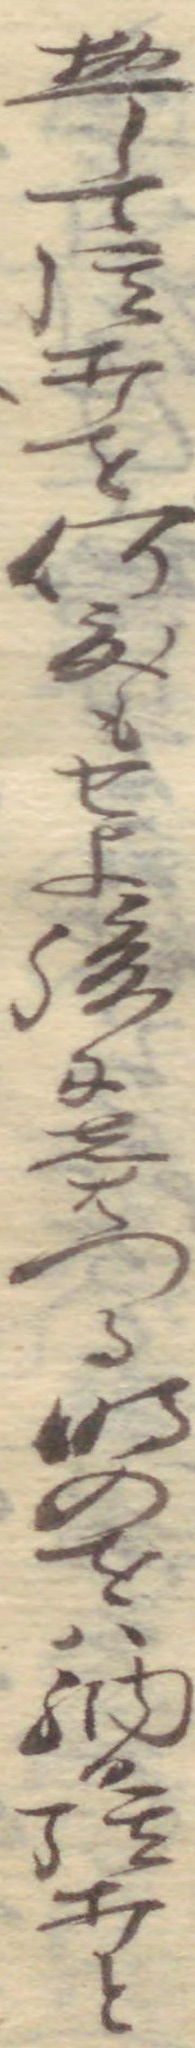惣して弦打を何度もせよ後にしはつる時のをハ納る弦打と
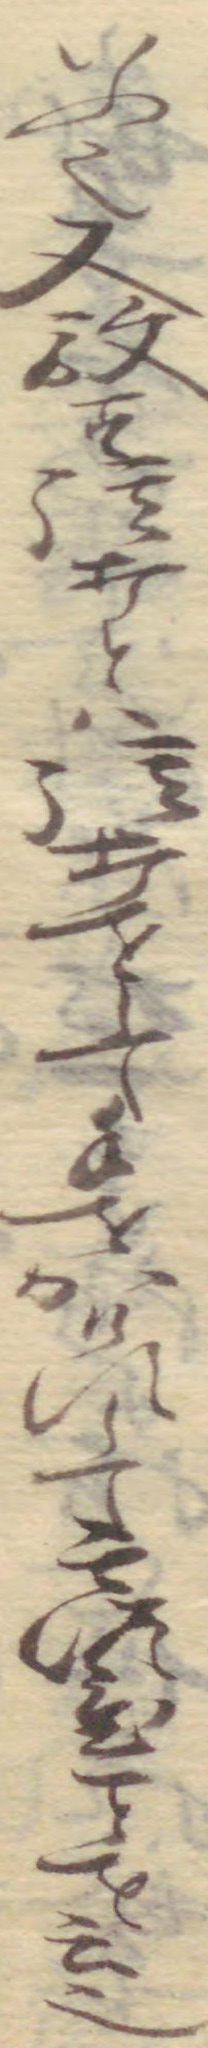いふ也又放す弦打とハ弦打をして手をかけすして其儘置ことを云也
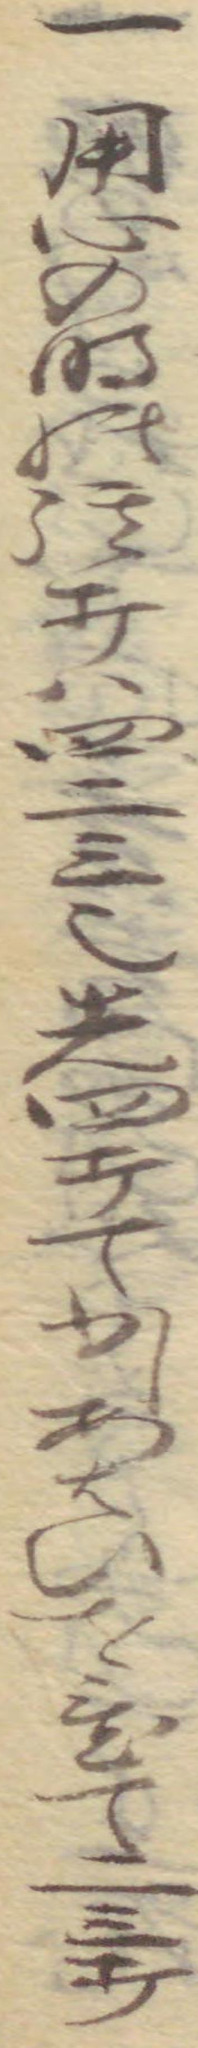一用心の時の弦打ハ四二三也先四打て少しあはひを置て二三打
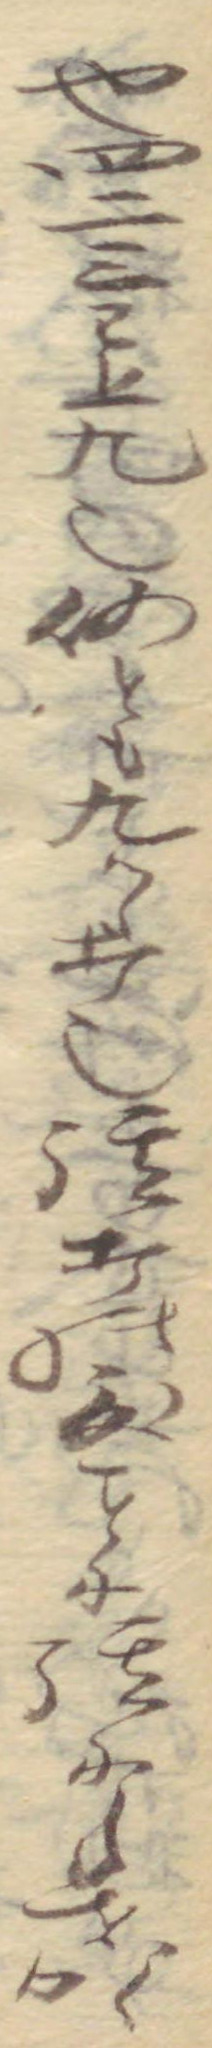也四二三已上九也何とも九ツヽ打也弦打の度ことに弦に手をかく
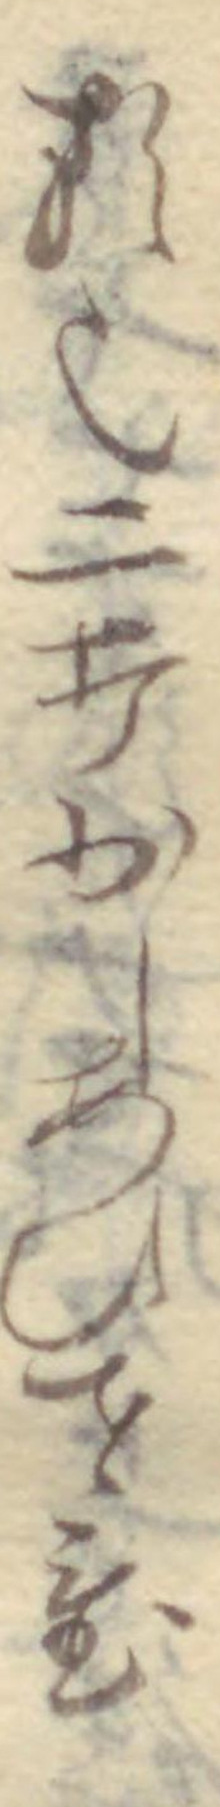る也二打少しあひを置
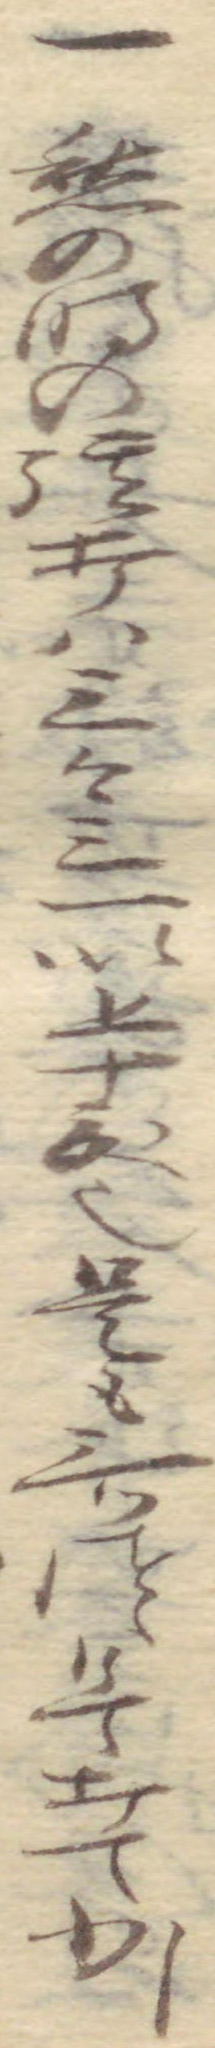一愁の時の弦打ハ三々三一以上十度也是も三ツつゝけて打て少し
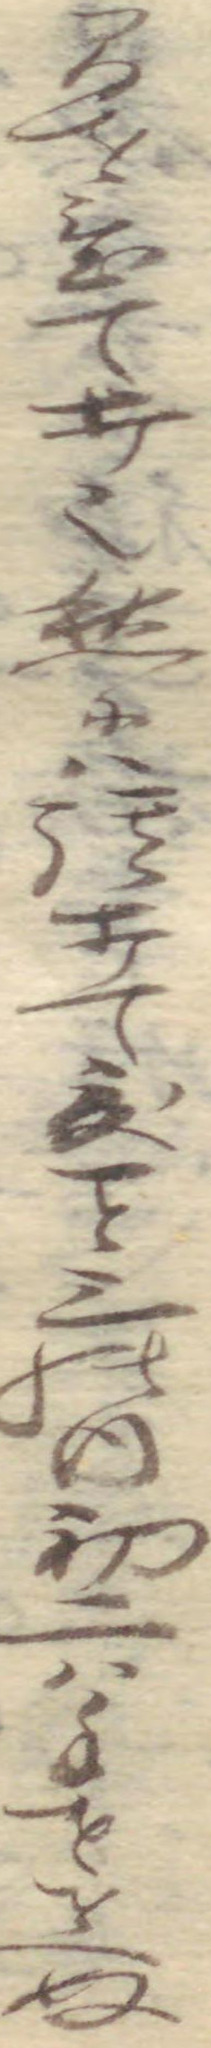間を置て打也愁にハ弦打て度こと三の内初二ハ手をそへぬ
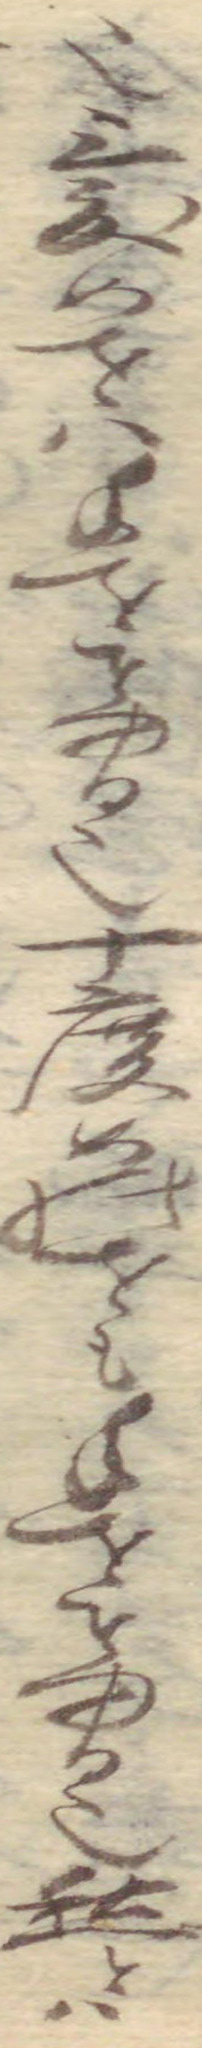也三度めをハ手をそゆる也十度めのをも手をそゆる也愁とハ
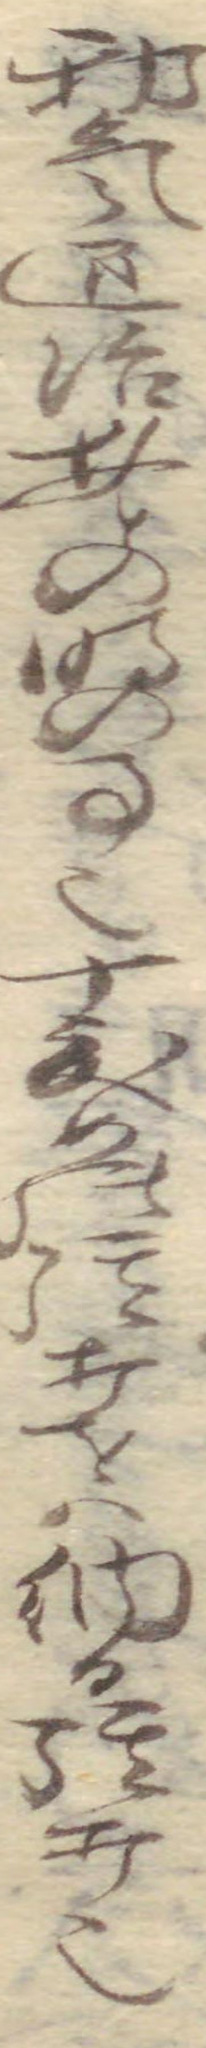邪気退治なとの時の事也十度めの弦打をは納る弦打也
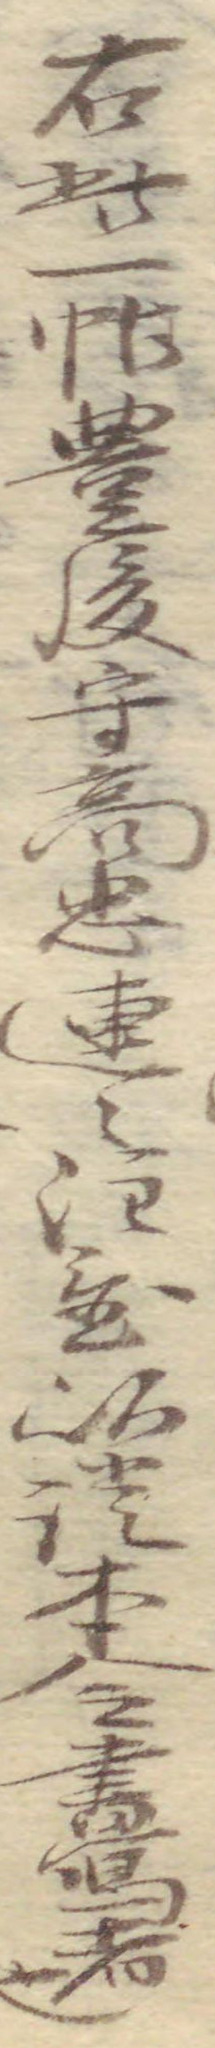一右此一帖豊後守高忠連々記置以證本令書寫者也
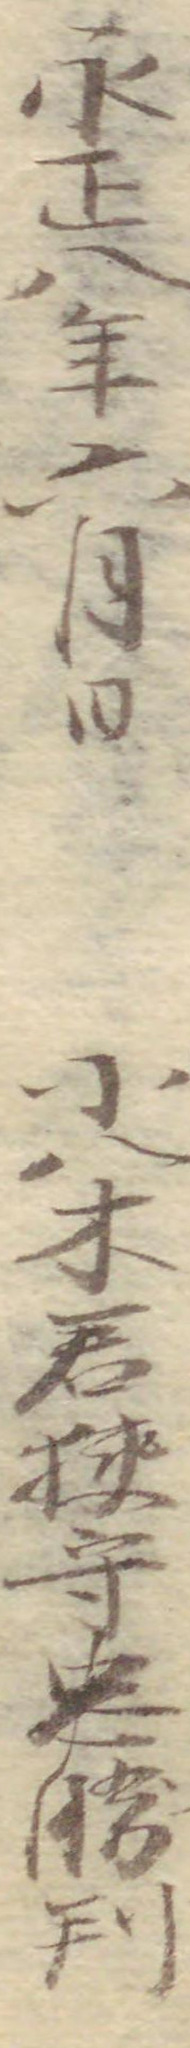永正八年六月日小八木若狭守忠勝判
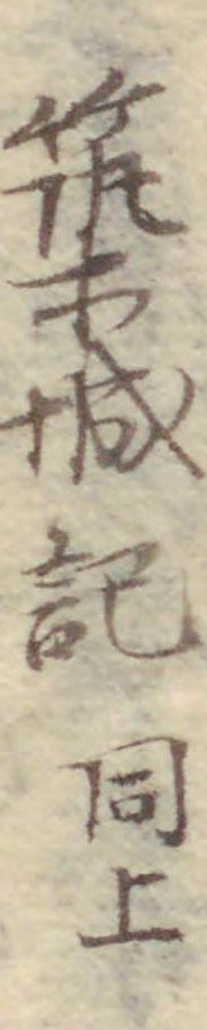築城記同上
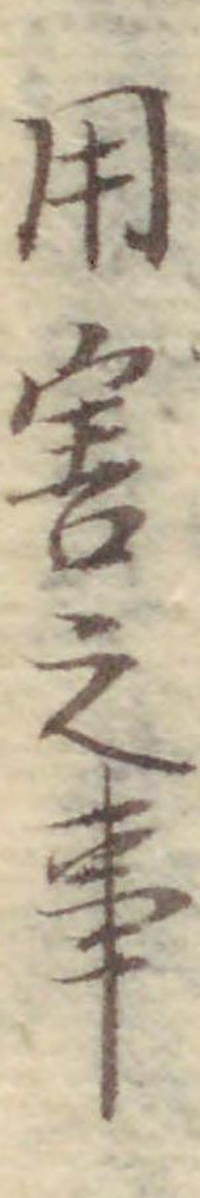用害之事
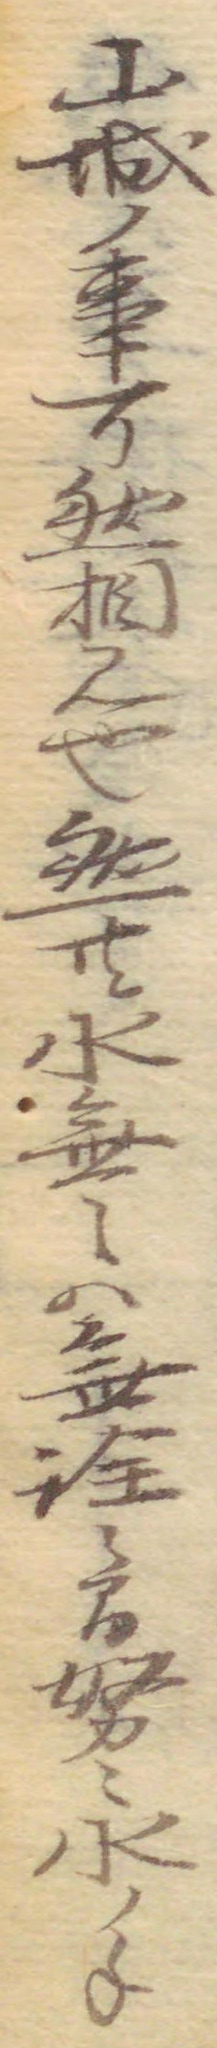山城ノ事可然相見也然共水無之ハ無栓候間努々水ノ手

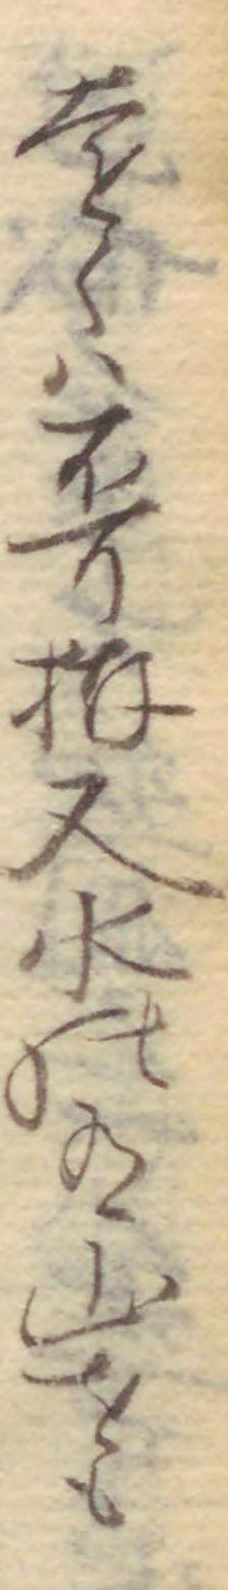遠くハ不可拵又水の有山をも
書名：鶯宿雑記. 巻199-200
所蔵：国立国会図書館 National Diet Library, JAPAN
